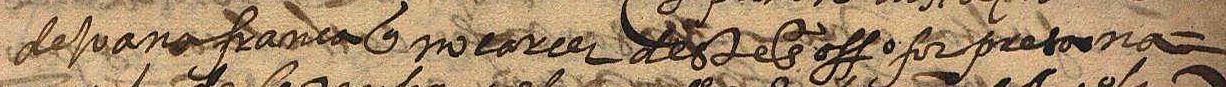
de Joana franca q̄ no carcer deste sto offo foi presa na
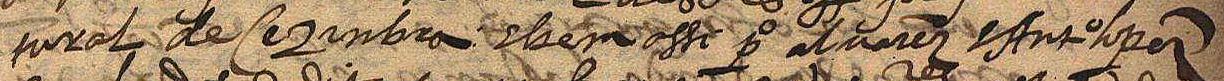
tural de Cezimbra E bem assi po aluarez e Anto lopez
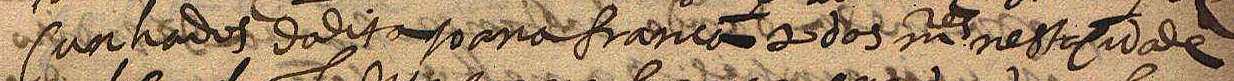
Cunhados da dita Joana franca todos mres nesta Cidade
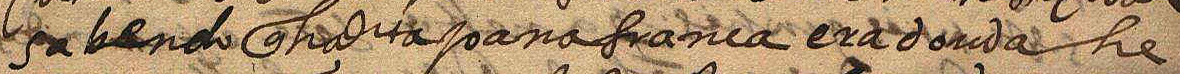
sabendo q̄ ha dita Joana franca era douda he
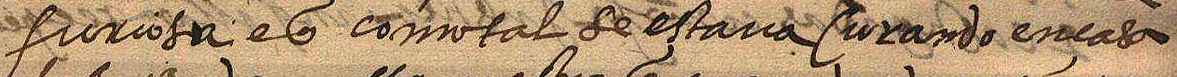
furiosa e q̄ como tal se estaua Curando en casa
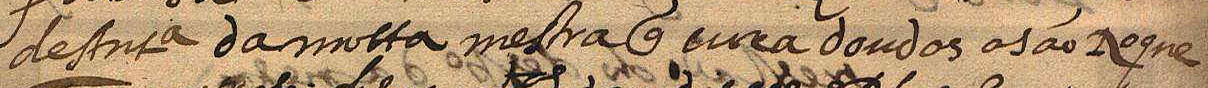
de Anta da motta mestra q̄ cura doudos a saõ Roque
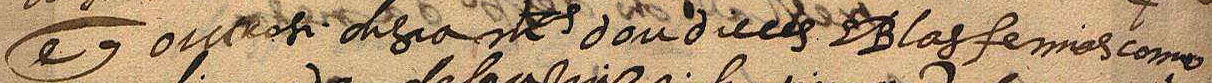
e q̄ outrosi dizia mtas doudices E Blasfemias como
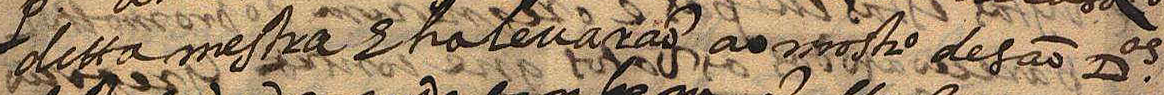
ditta mestra E ha leuaraõ ao mostro de são Dos.
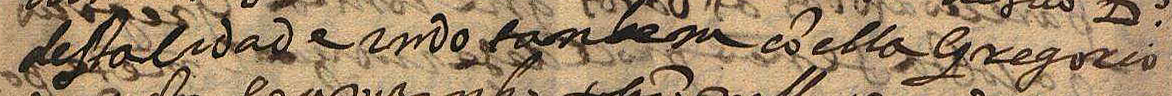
desta cidade indo tanbem cō ella Gregorio
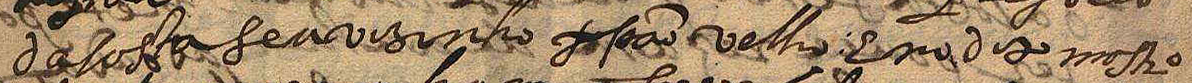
da Costa seu vizinho xpão velho: E no dito mostro
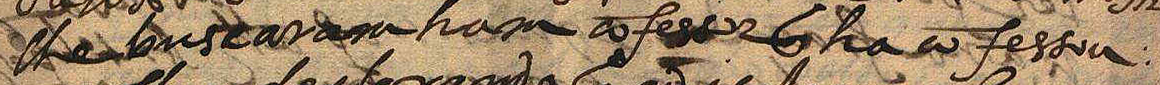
lhe buscaram hum c̄ofessor q̄ ha cōfessou
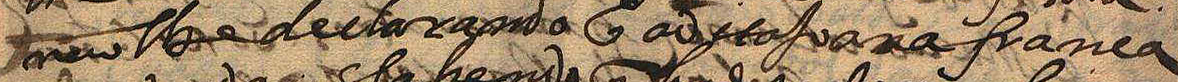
naõ lhe declarando q̄ a dita Joana franca
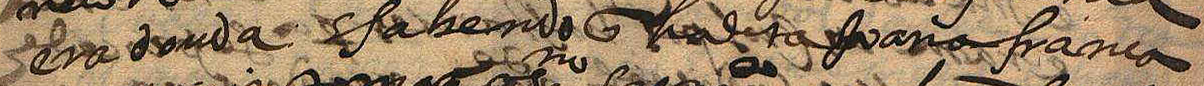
era douda E sabendo q̄ ha dita Joana franca
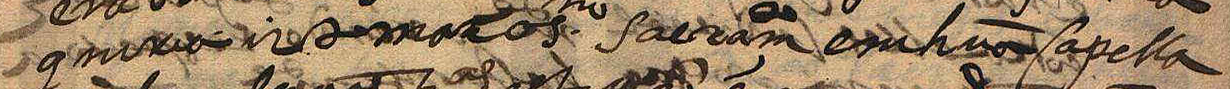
quiria ir tomar o smo. sacramto em huā Capella
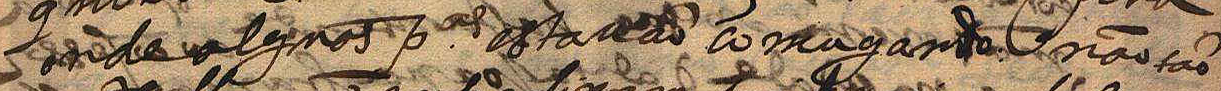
onde alguās pas estauão cōmugando não tão
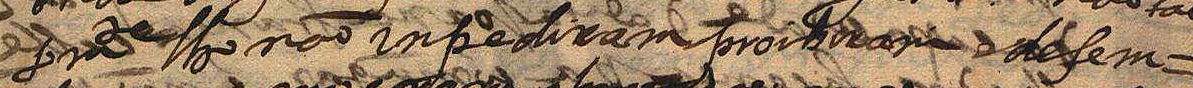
somte lho naõ inpediram proibiram e defem
